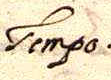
Tempo.
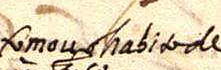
tomou o habito de
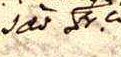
são Fr.co
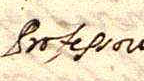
Professou
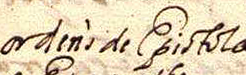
orden̄s de Epistola
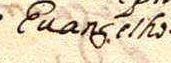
e Euangelho.
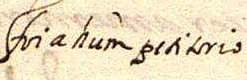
Foi a hum̄ petitorio.
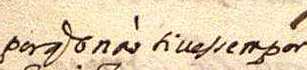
porq̄ o naõ tiuessem por
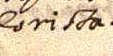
corista.
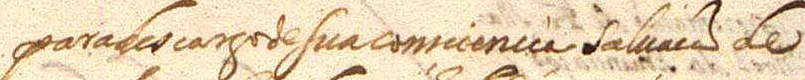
para descargo de sua consçiençia, saluação de
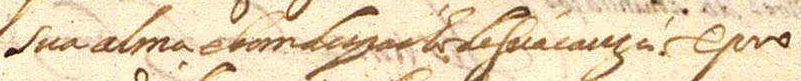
sua alma, e bom despacho de sua cauza. E pro
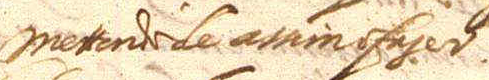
mettendo de assim o fazer.
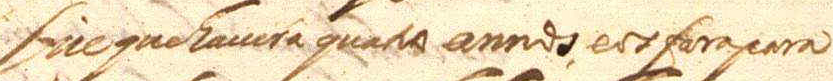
Diçe que hauera quatro annos, e os fara para
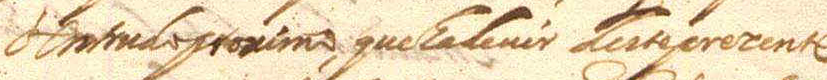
o entrudo proximo, que ha de uir deste prezente
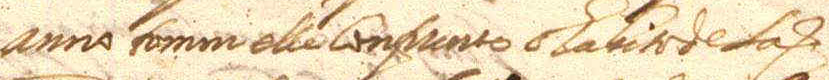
anno tomou elle Confitente o habito de Saõ
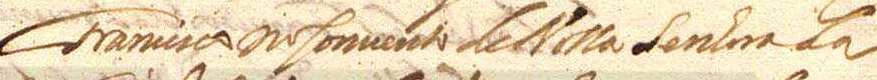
Françisco na Conuento de Nossa Senhora da
